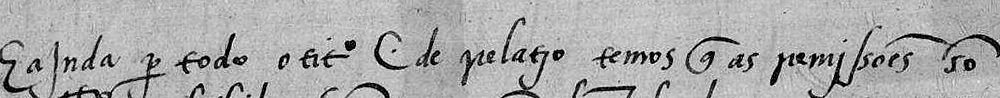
E aJnda ꝑ todo o tito C. de relatjo temos q̄ as remjssões s̄o
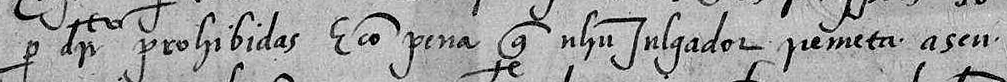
ꝑ drrto prohibidas E c̄o pena q̄ nhū Julgador remeta. a seu
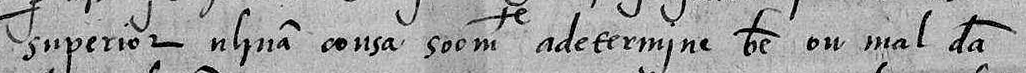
superior nhūa cousa soomte a determjne bē ou mal dā
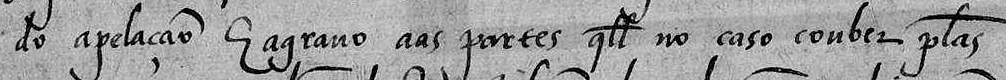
do apelaçaõ E agrauo aas partes q̄ll no caso couber p̄las
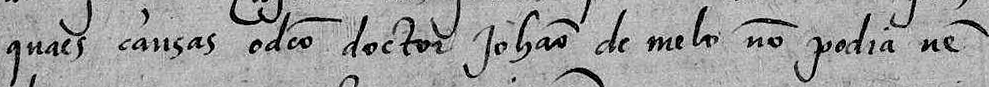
quaes causas o dc̄o doctor Johão de melo n̄o podia nē
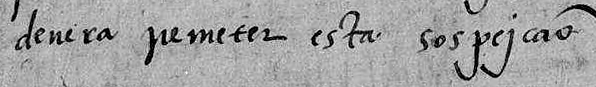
deuera remeter esta sospejçaõ
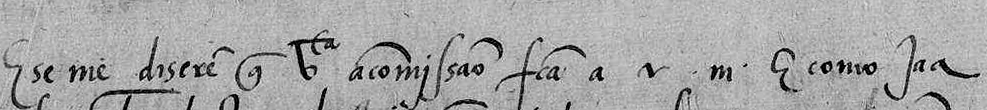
E se me diserē q̄ vta a c̄omjssaõ fc̄a a v .m. E como Jaa
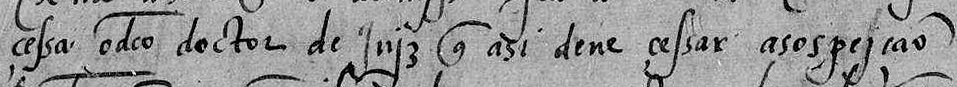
cessa o dc̄o doctor de Jujz q̄ asi deue cessar a sospejçaõ
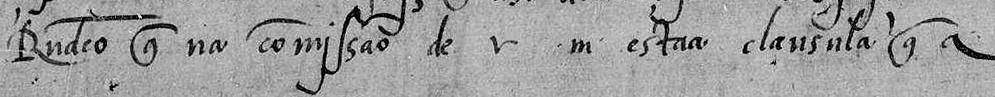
Rūdeo q̄ na c̄omjssão de v m estaa clausula q̄ a
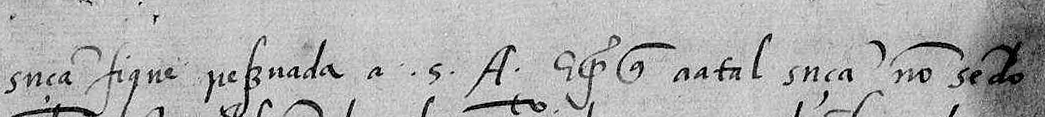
snçā fique reꞩuada a .s. A. E pō q̄ aa tal snça n̄o sēdo
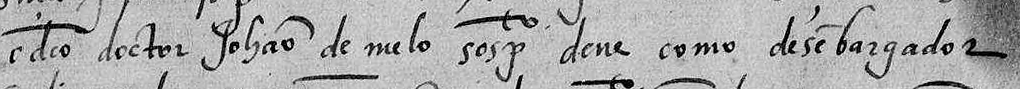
o dc̄o doctor Johão de melo sospto deue como desēbargador
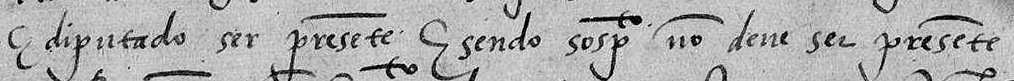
E diputado ser presēte E sendo sospto n̄o deue ser prēsete
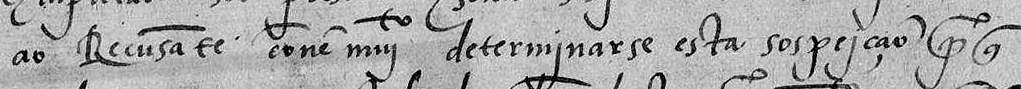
ao Recūsate cōuē mujto determjnarse esta sospejção p̄oq̄
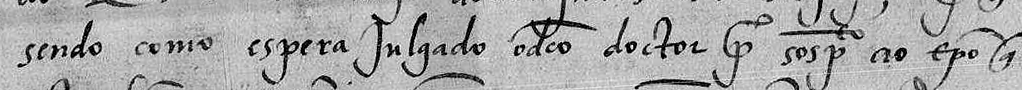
sendo como espera Julgado o d̄co doctor p̄o sospto ao tp̄o q̄
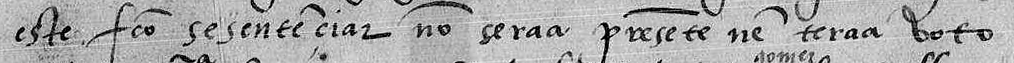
este fc̄o se sentēciar n̄o seraa presēte nē teraa voto
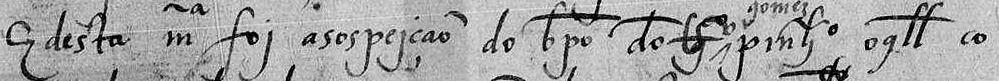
E desta mra foj a sospejção do b̄po dō Ro gomez pinhro o q̄ll co
